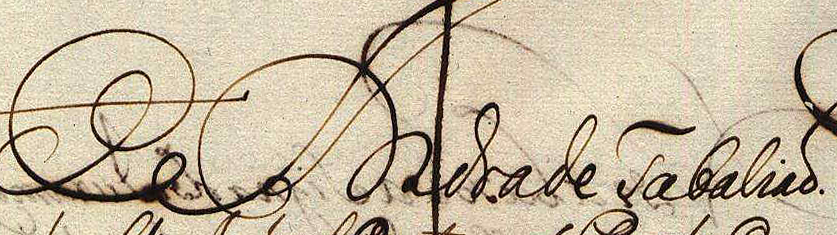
Andrade Tabaliaõ.
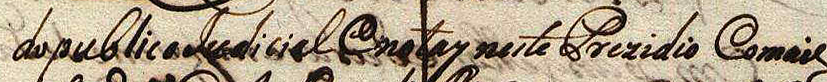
do publico Iudicial E notas neste Prezidio E o mais
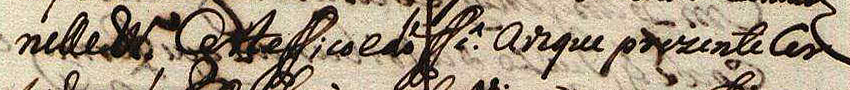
nelle &.a Certeffico e dô fê aos que prezente cer
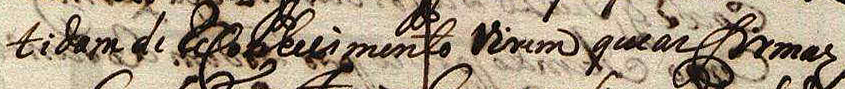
tidam de Reconhecimento virem que as firmas
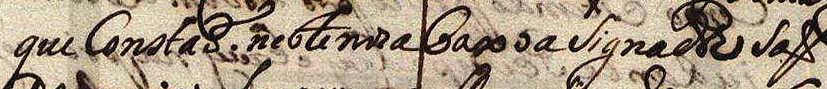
que Constaõ neste noso baxo asignado saõ
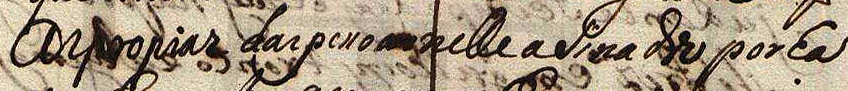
As propiaz das pessoas nelle asinados por ha
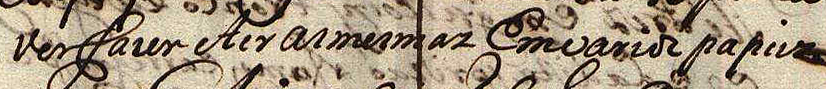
ver fazer e ter as mesmaz Em varioz papeiz
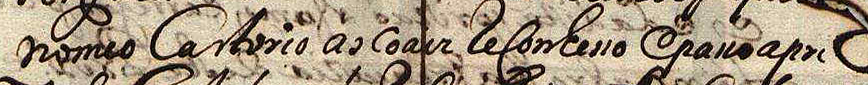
no meo Cartorio as coaiz ReConhesso E passo a pre
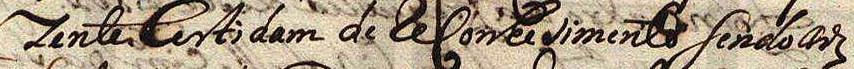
Zente Certidam de ReConhesimento sendo aoz
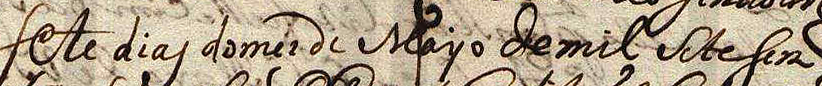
sete dias do mes de Mayo de mil Setesen
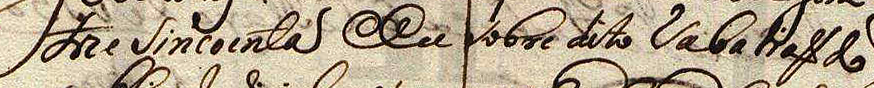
toz e sincoenta E Eu sobredito Tabaliaõ do
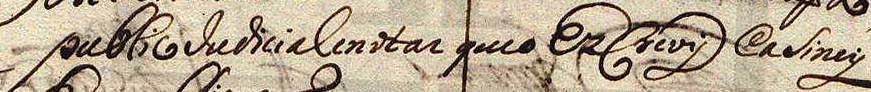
publico Iudicial e notas que o EzCrevy E asiney
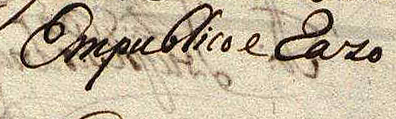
Em publico e Razo
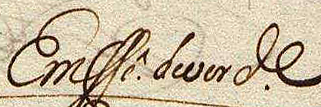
Em ffê. de verd.e
